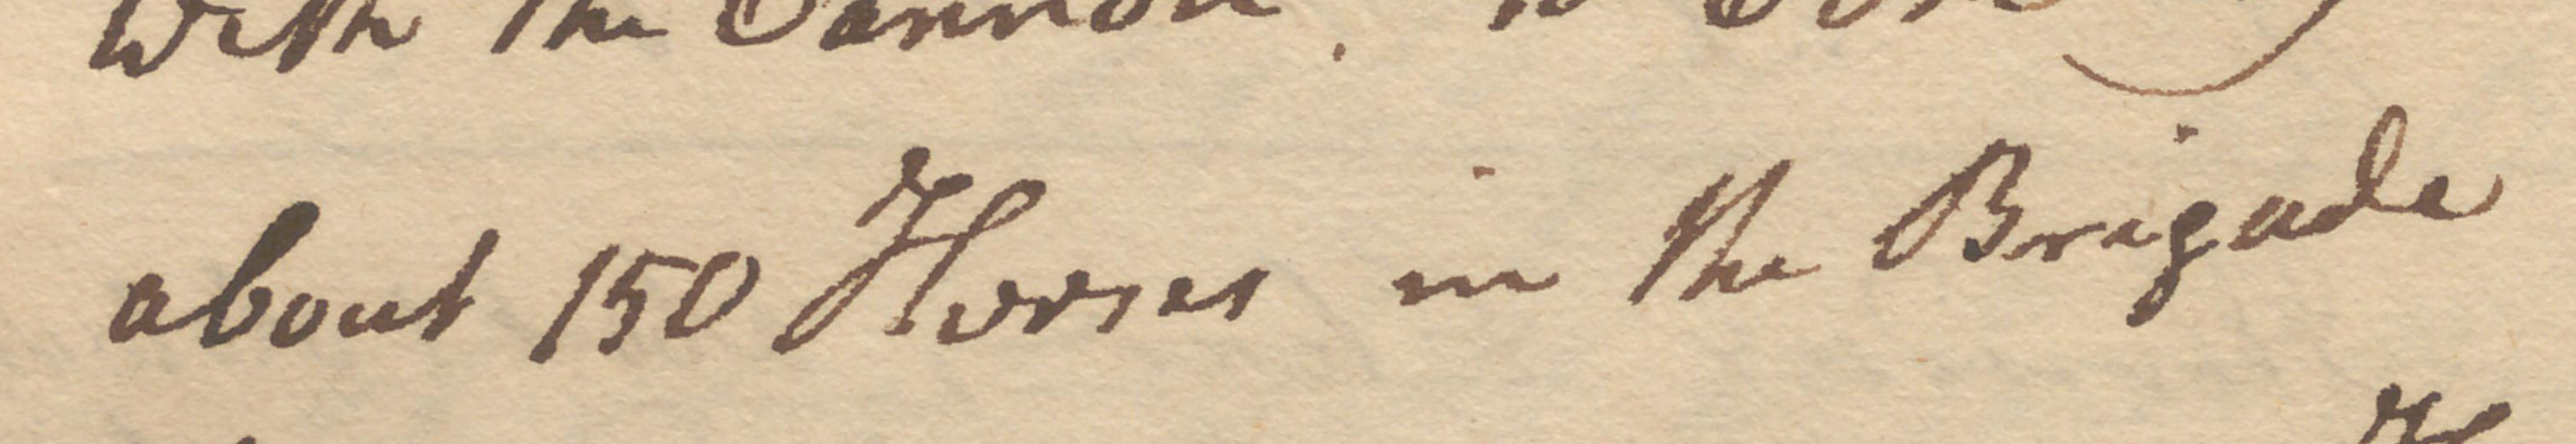about 150 Horses in the Brigade
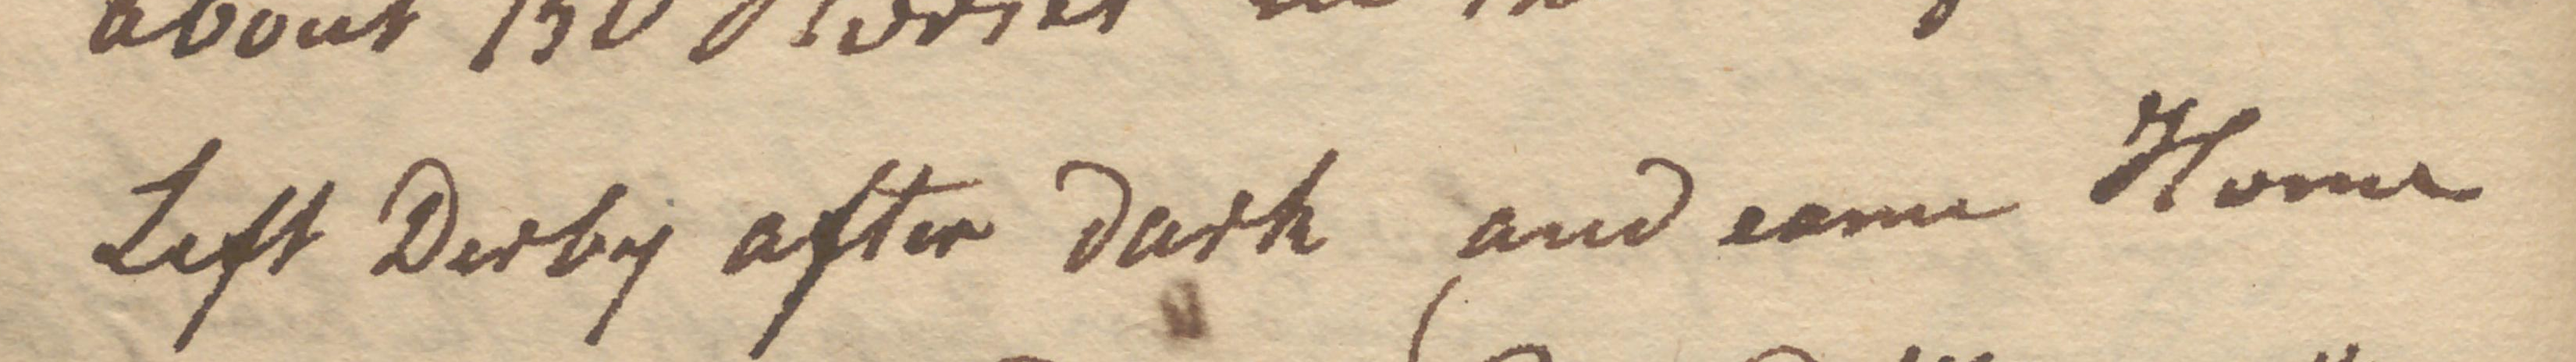Left Darby after dark and came Home
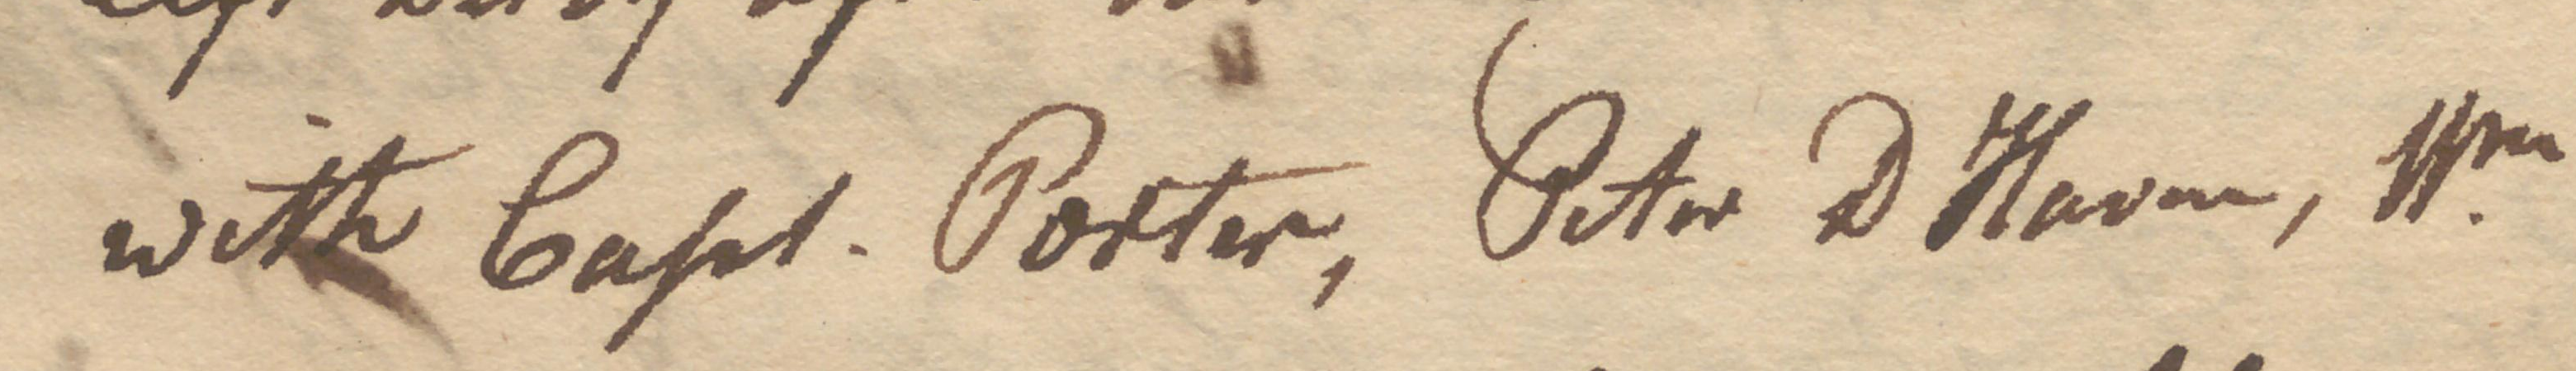with Captl. Porter Peter D Havon, W^m.
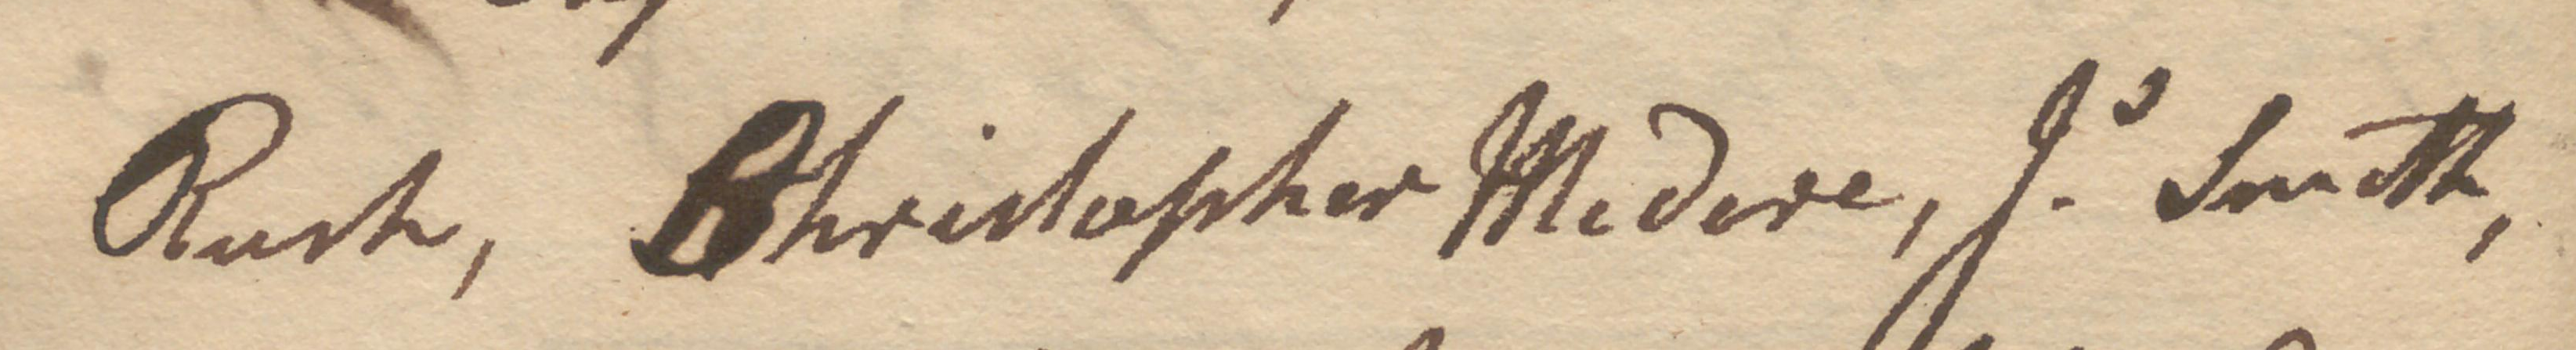Rush, Christopher Midere, J^s. Smith
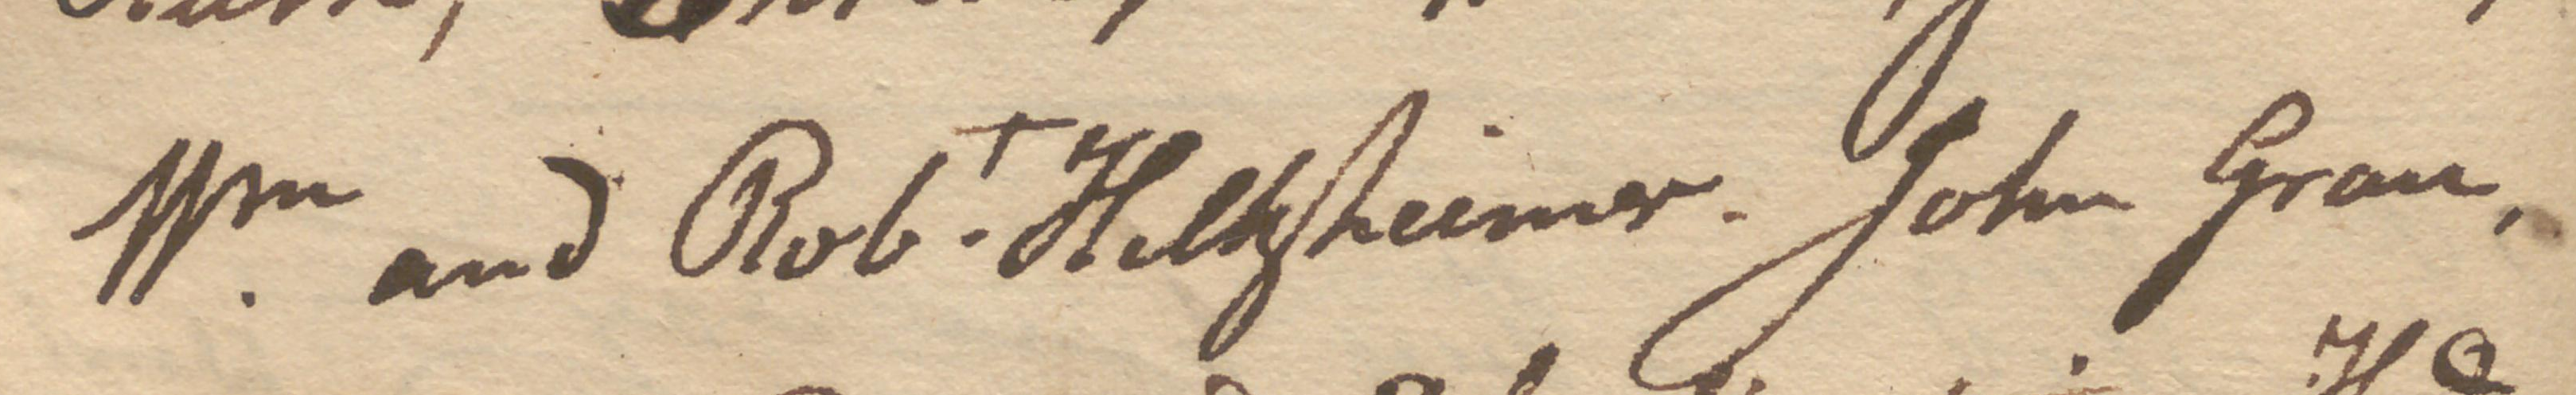W^m. and Rob^t. Hillzheimr. John Grau,
